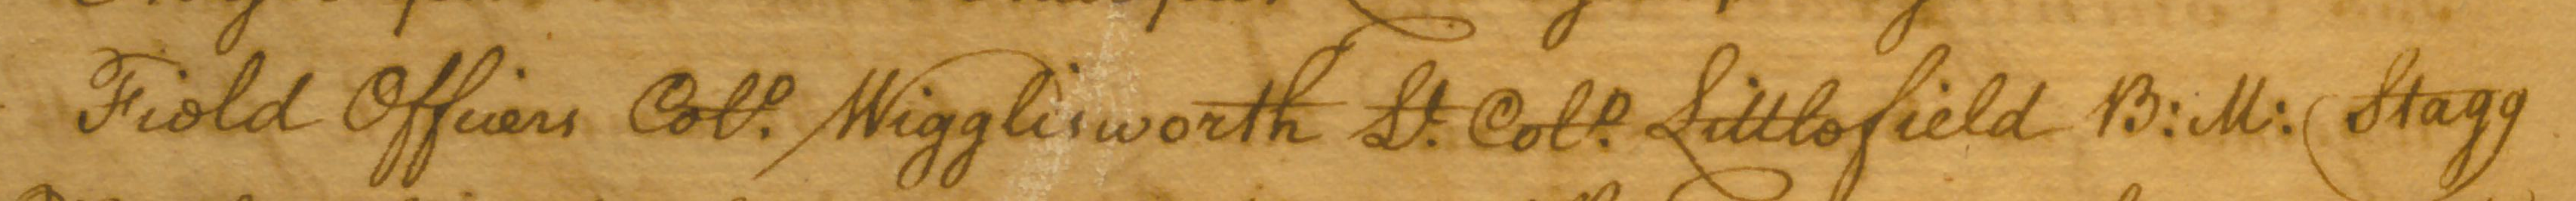Field Officers Col^o. Wigglesworth L^t. Col^o. Littlefield B: M: Stagg
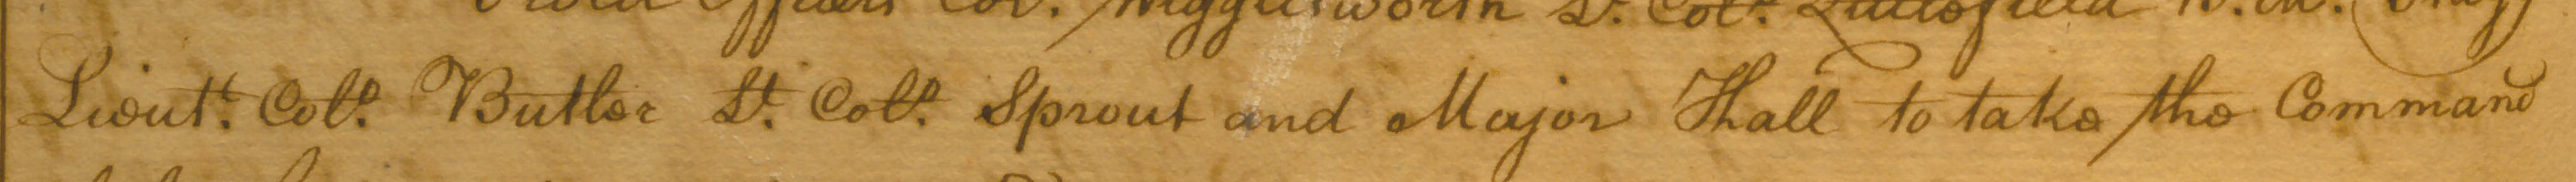Lieut^t. Col^o. Butler L^t. Col^o. Sprout and Major Hall to take the Command
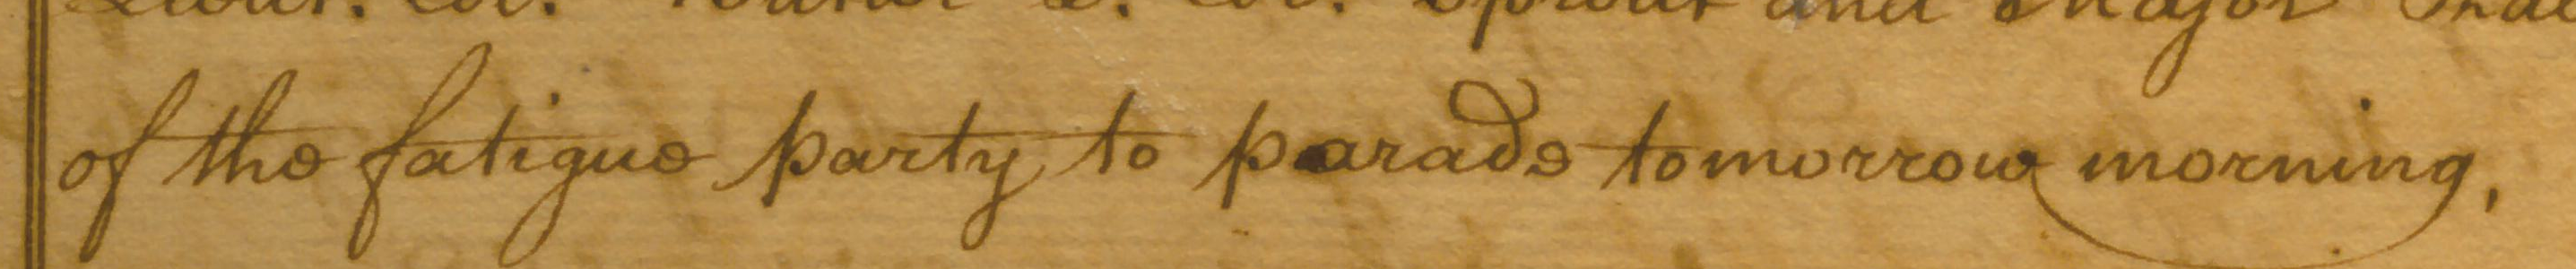of the fatigue party to parade tomorrow morning.
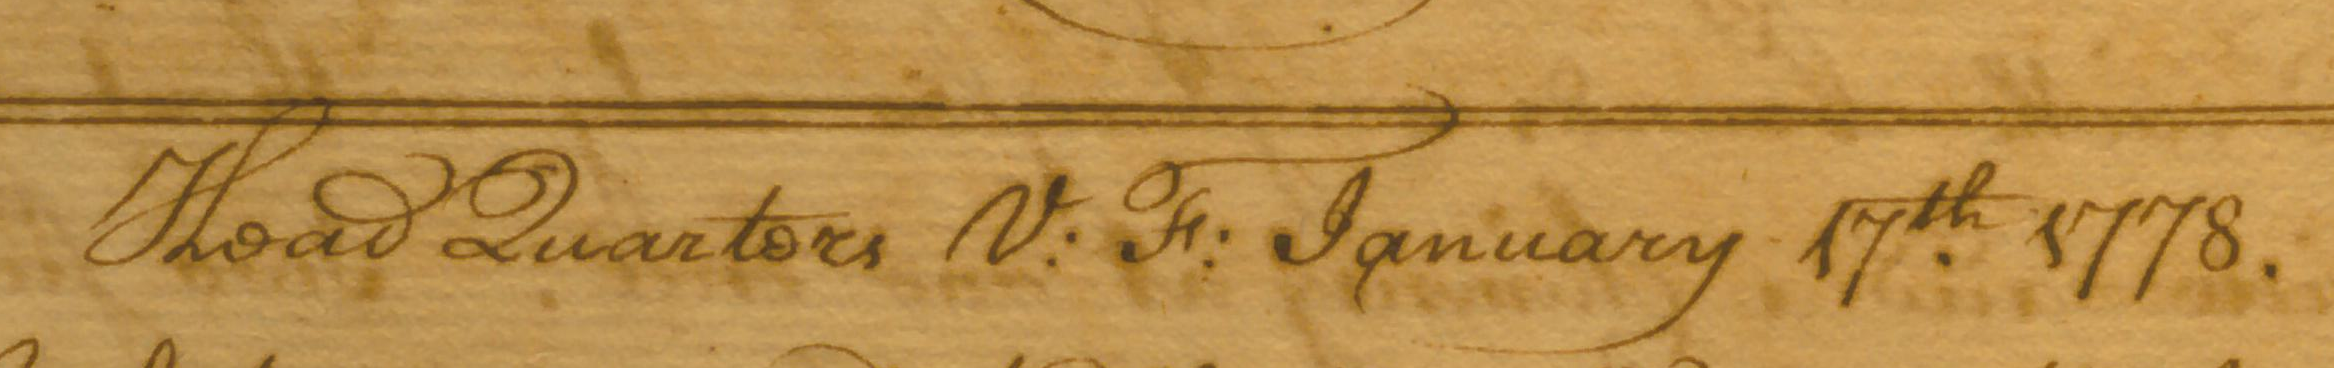Head Quarters V: F: January 17^th. 1778.
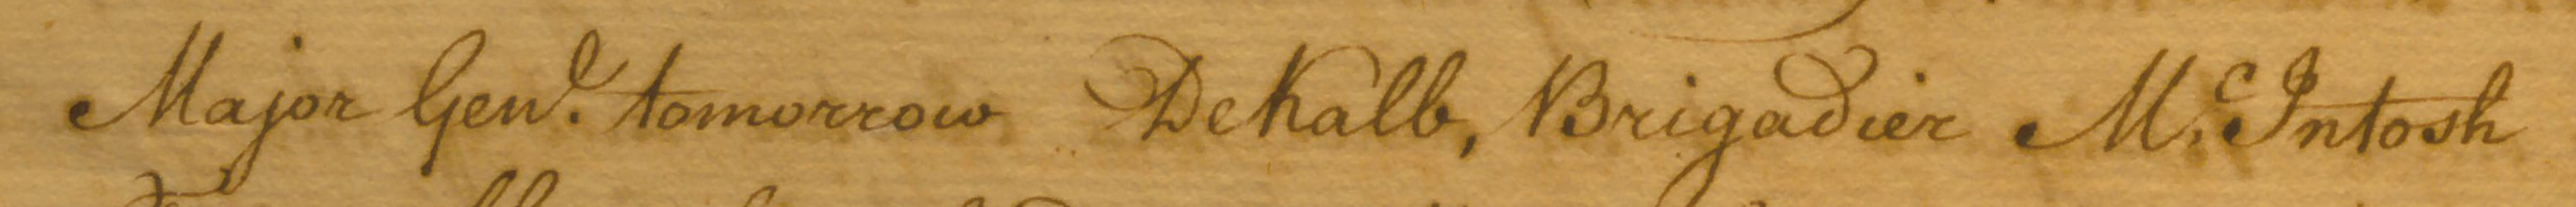Major Gen^l. tomorrow De Kalb Brigadier M^c.Intosh
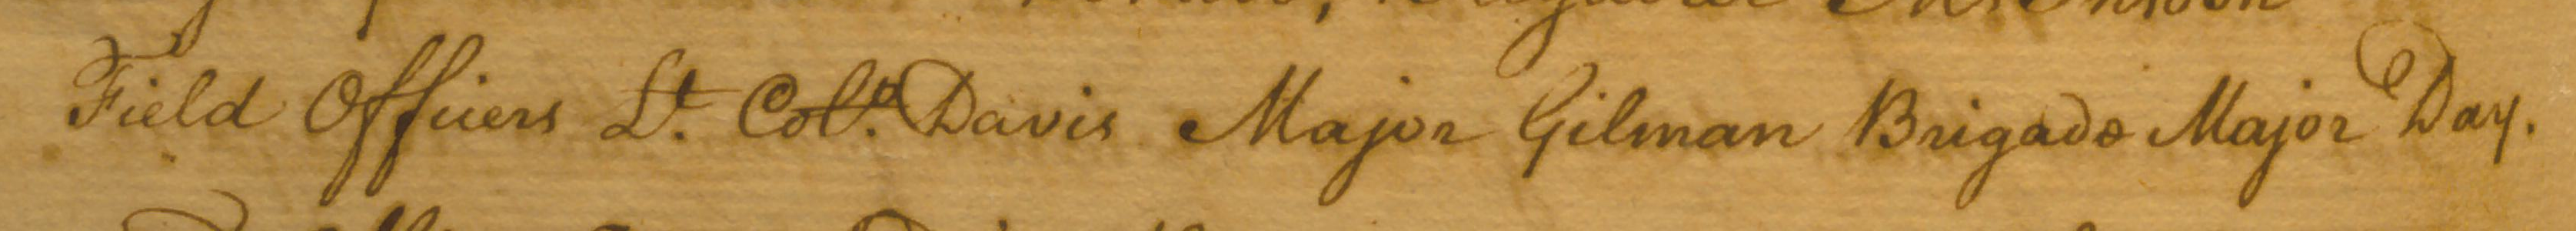Field Officers L^t. Col^o. Davis Major Gilman Brigade Major Day.
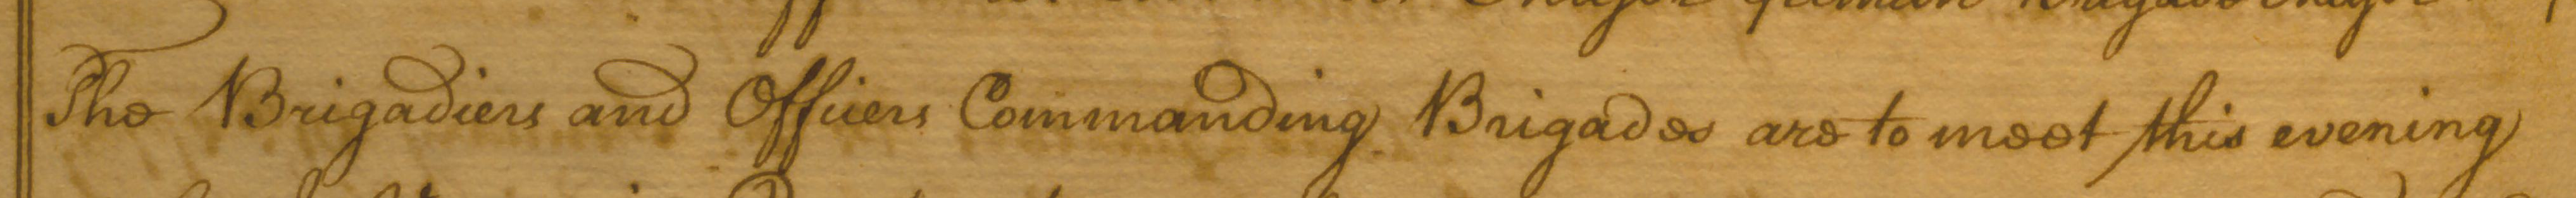The Brigadiers and Officers Commanding Brigades are to meet this evening
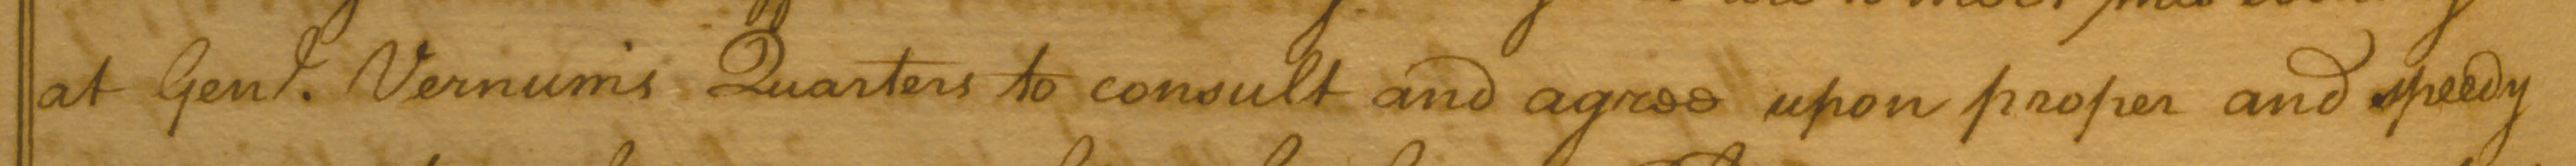at Gen^l. Vernum's Quarters to consult and agree upon proper and speedy
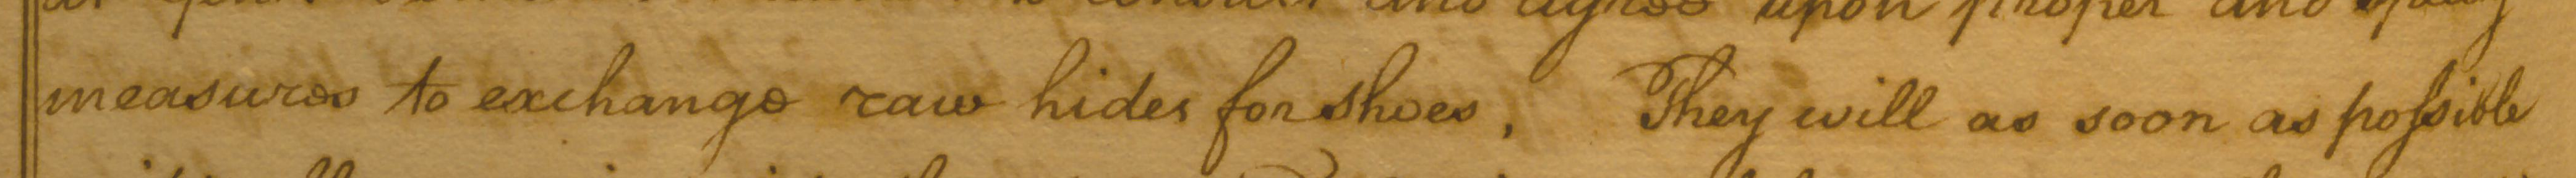measures to exchange raw hides for shoes. They will as soon as possible
